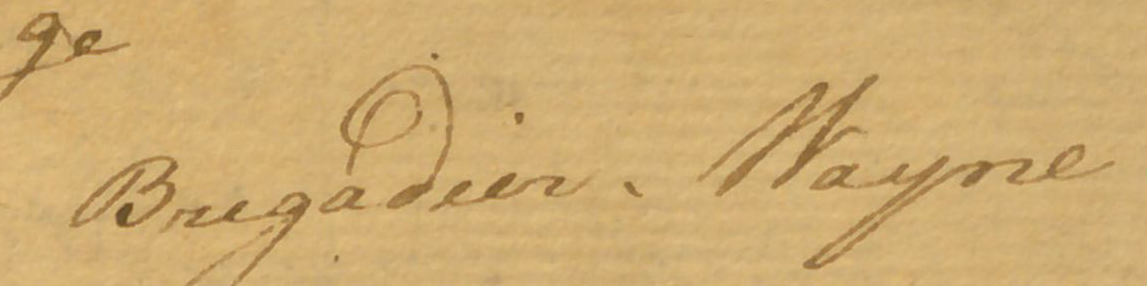Brigadier. Wayne
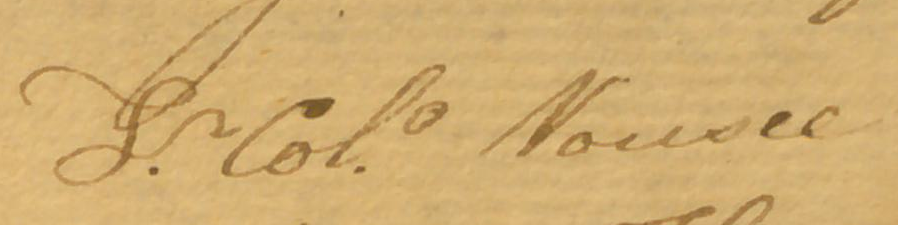L^t. Col^o. Vousee
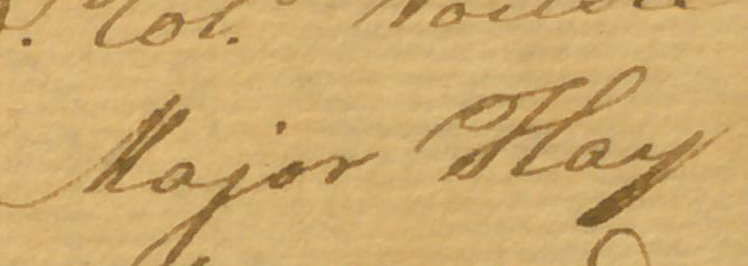Major Hay
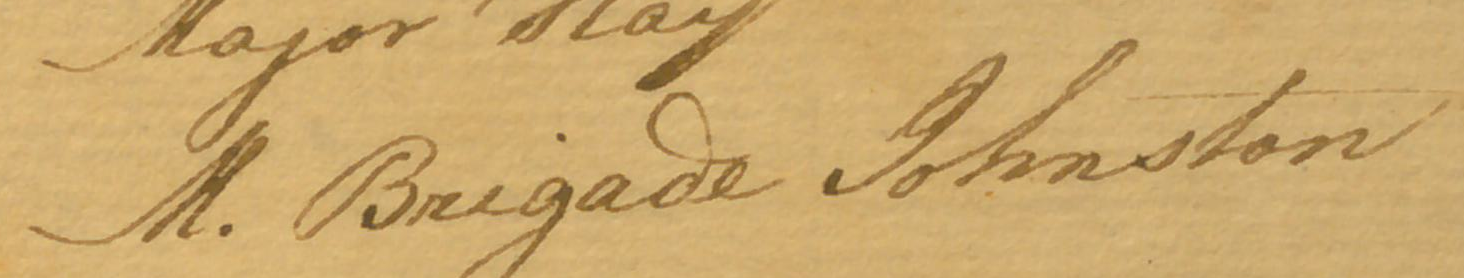M. Brigade Johnston
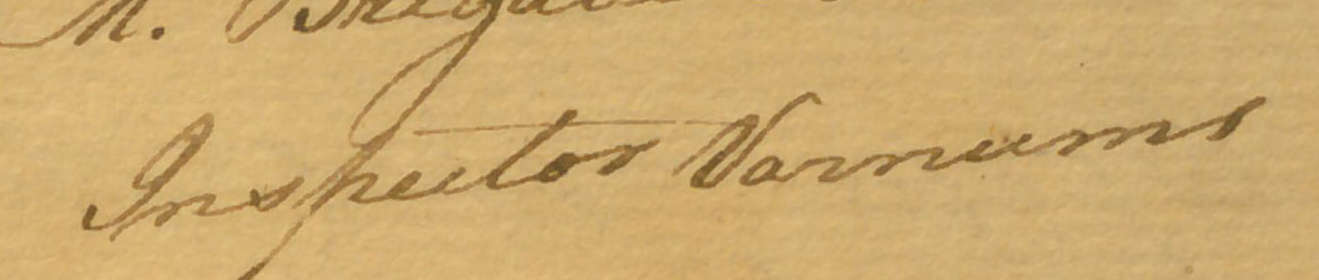Inspector Varnums
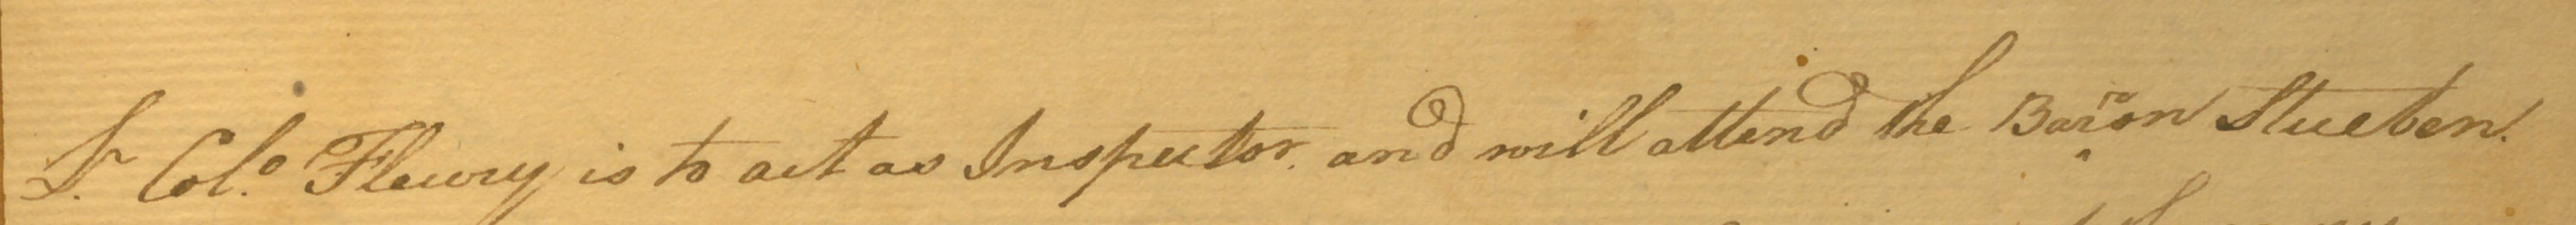L^t. Col^o. Fleury is to act as Inspector and will attend the Bar^ron Stueben
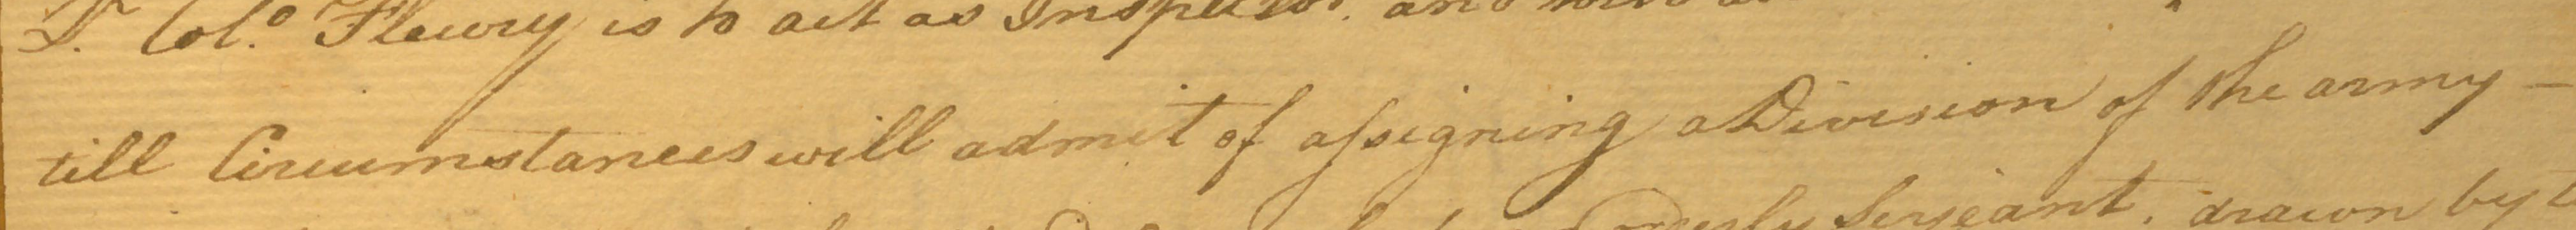till Circumstances will admit of assigning a Division of the army-
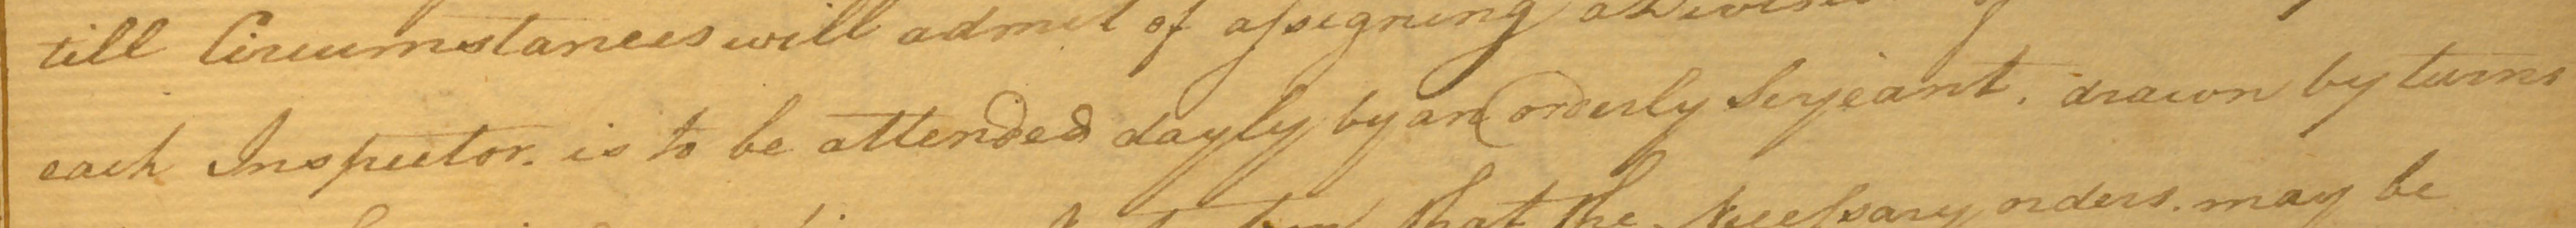each Inspector is to be attended dayly by an orderly Serjeant, drawn by turns
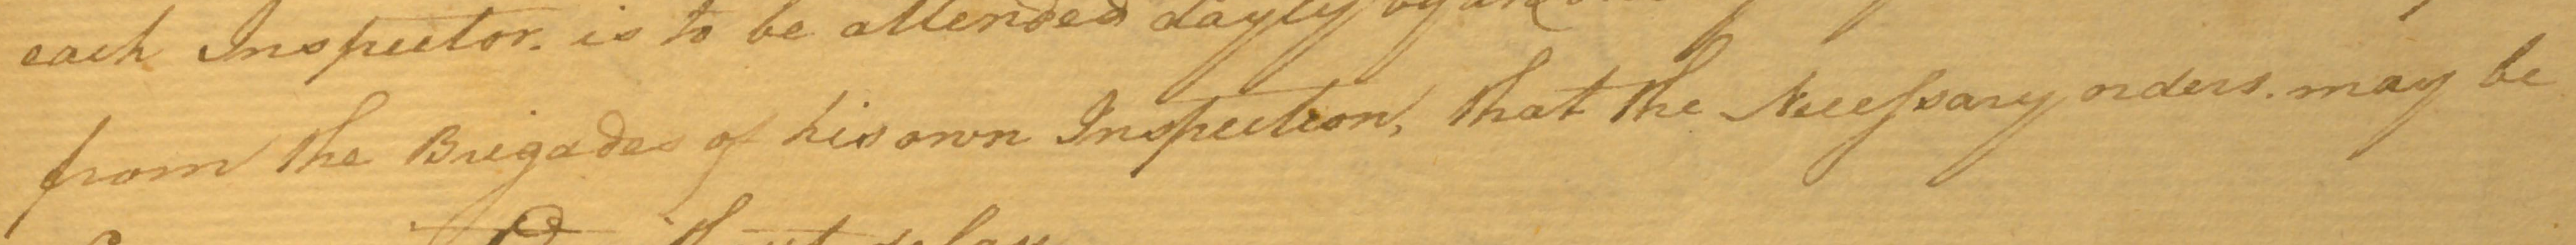from the Brigades of his own Inspection, that the Necessary orders may be
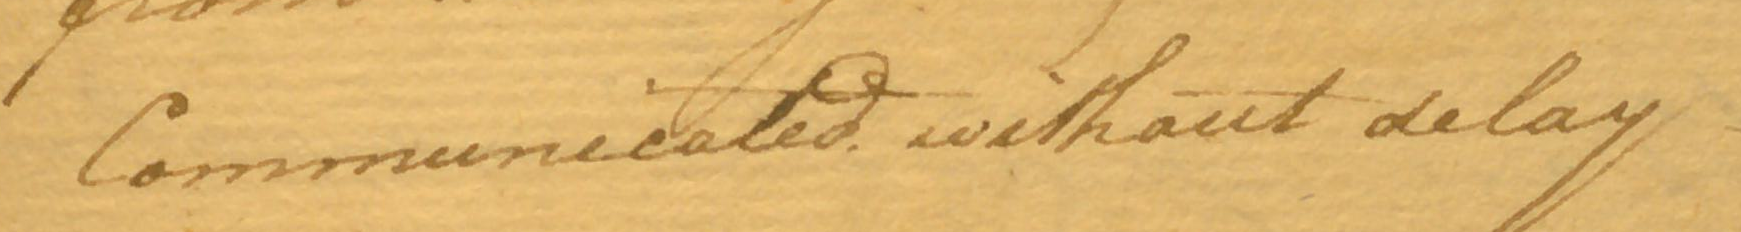Communicated without delay
